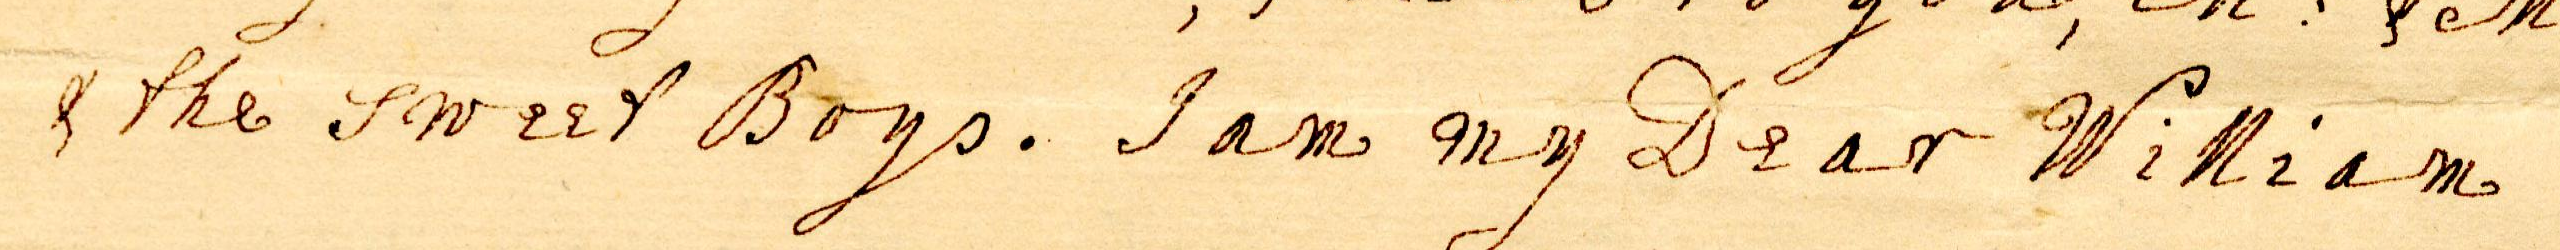& the sweet Boys. I am my Dear William
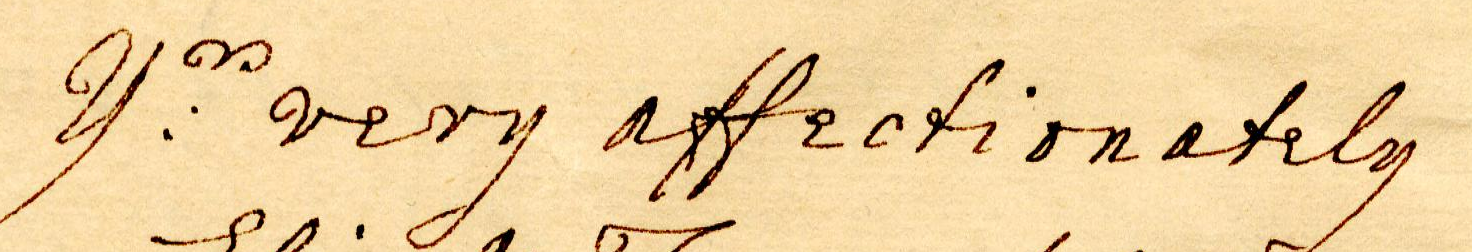Y^rs: very affectionately
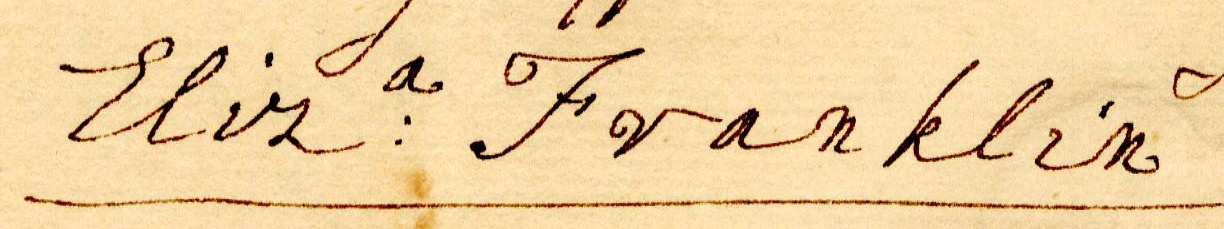Eliz^a: Franklin
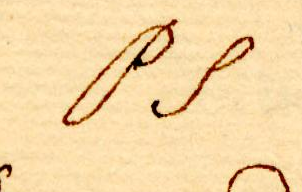PS
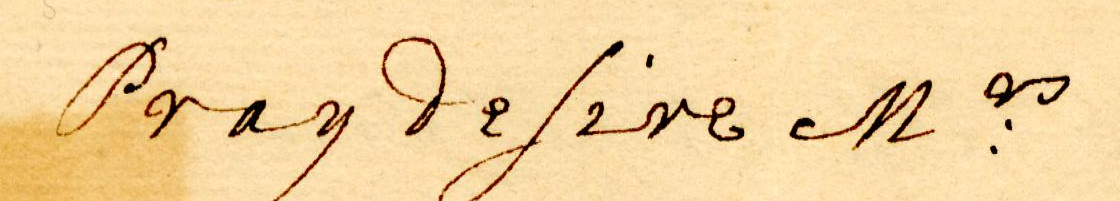Pray desire M^rs:
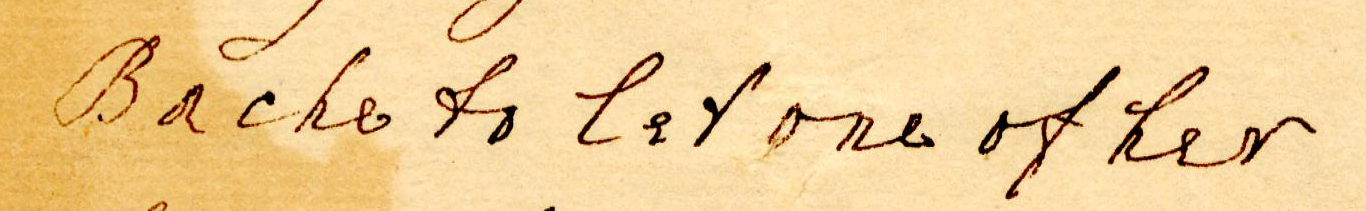Bache to let one of her
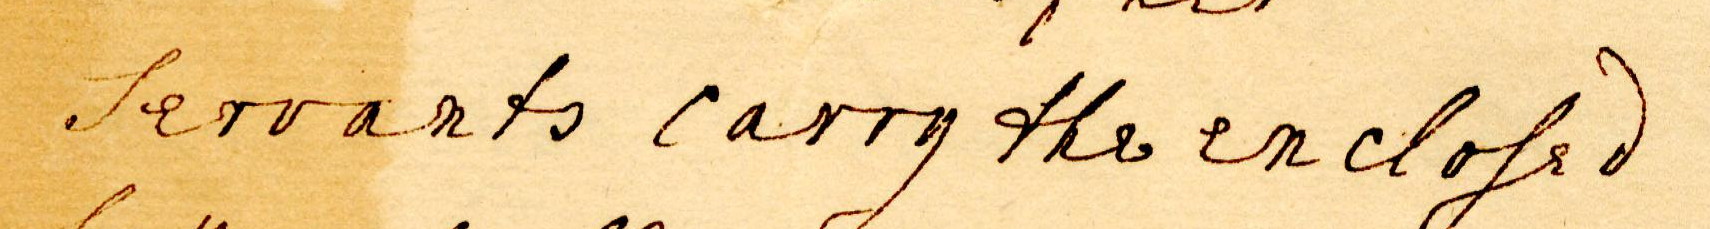servants carry the enclosed
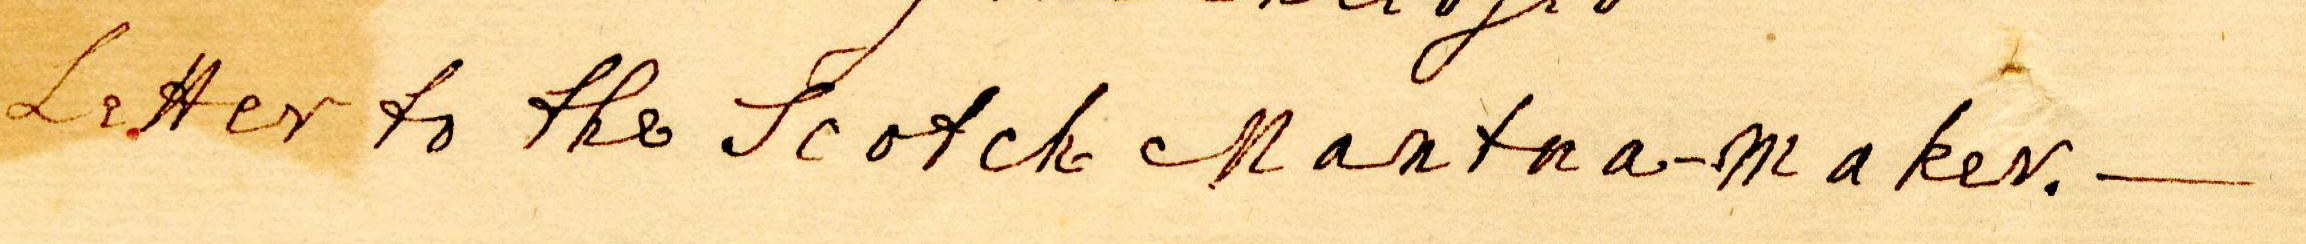Letter to the Scotch Mantua-Maker.-
